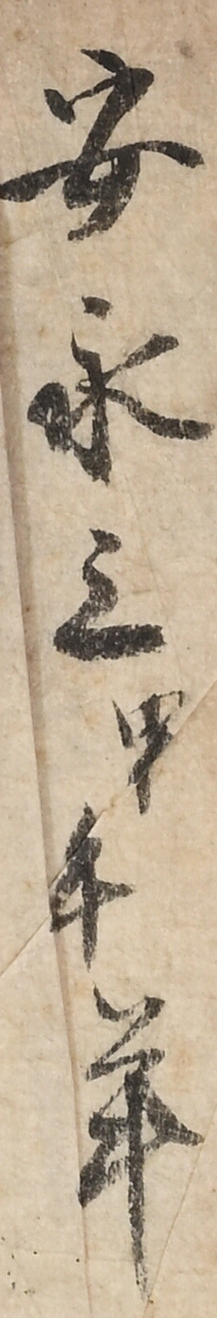安永三甲午年
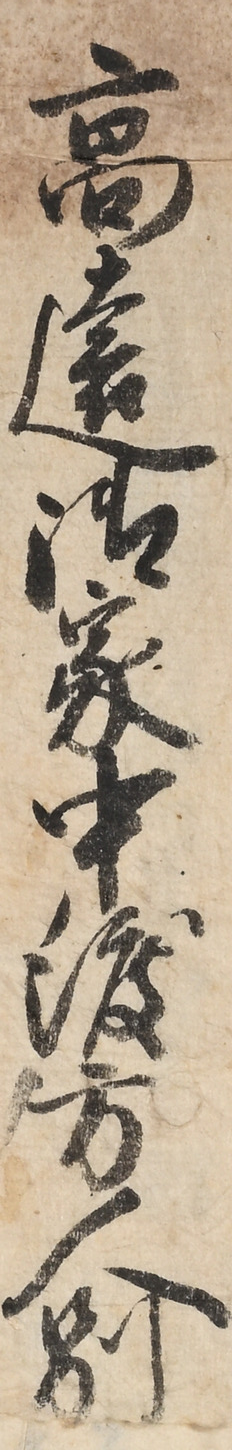高遠御家中渡方人別
